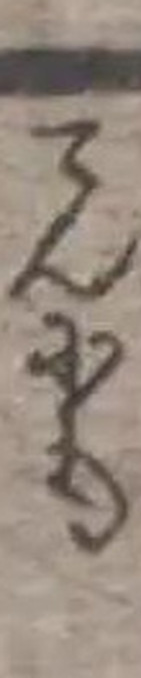てんにも
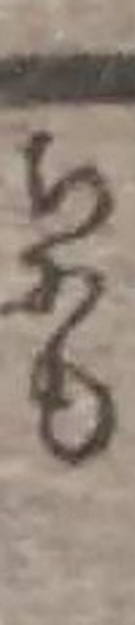ちにも
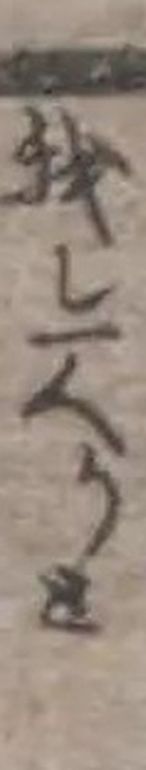我し一人りと
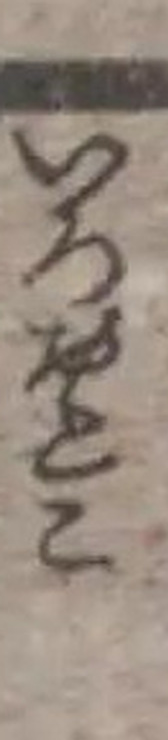いろおとこ
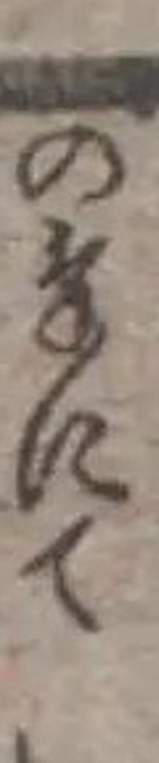の身にて
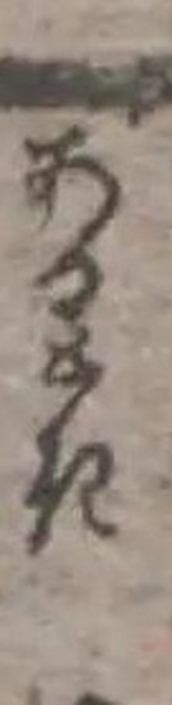あるとき
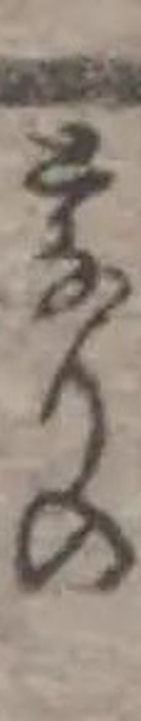となりの
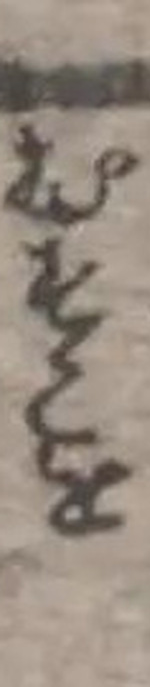むすこを
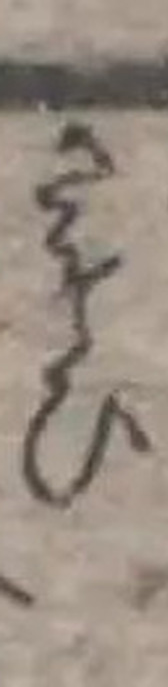さそひ
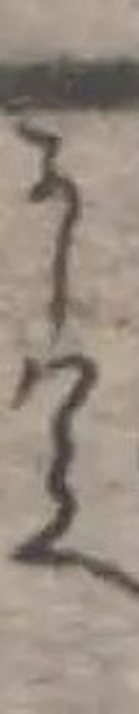よしわらへ
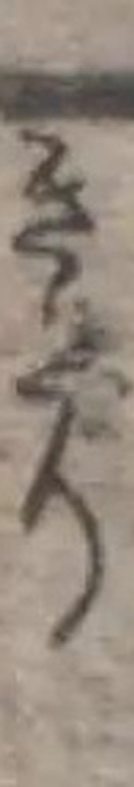きたり
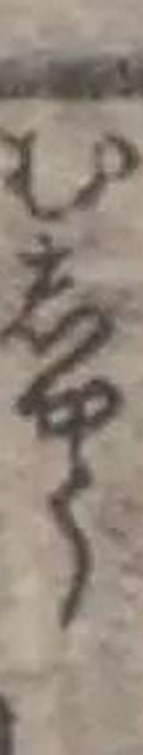むしやう
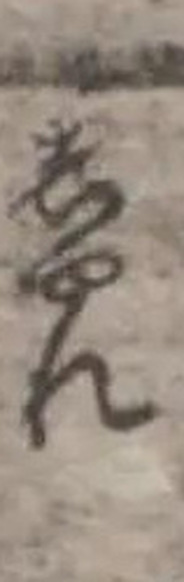しやれ
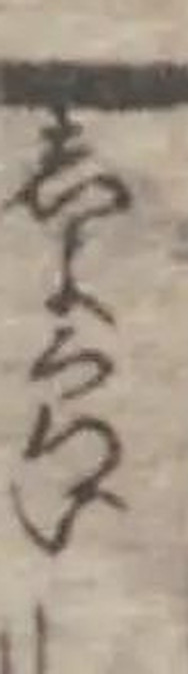しよくわい
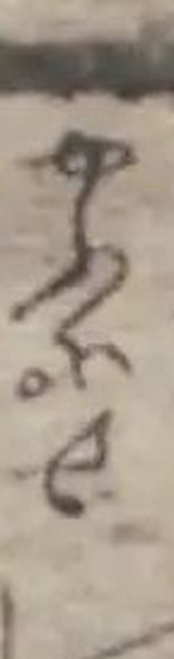やほにせ
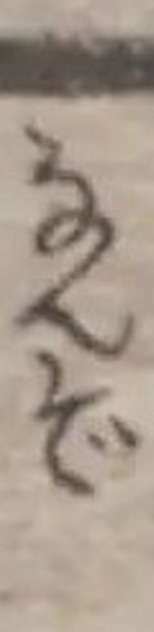なんぞ
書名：早出来 3巻
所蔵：国立国会図書館 National Diet Library, JAPAN
